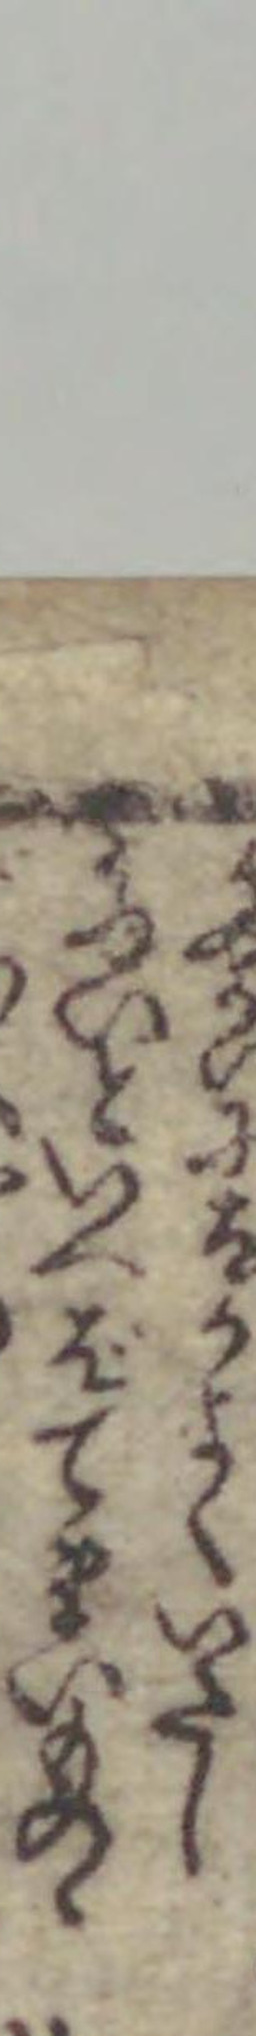たいといへばてまいものゝ
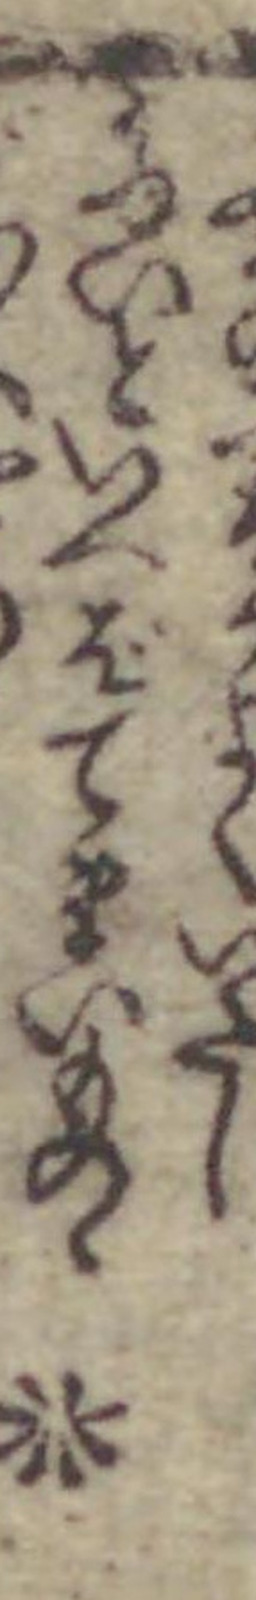たいといへばてまいものゝ
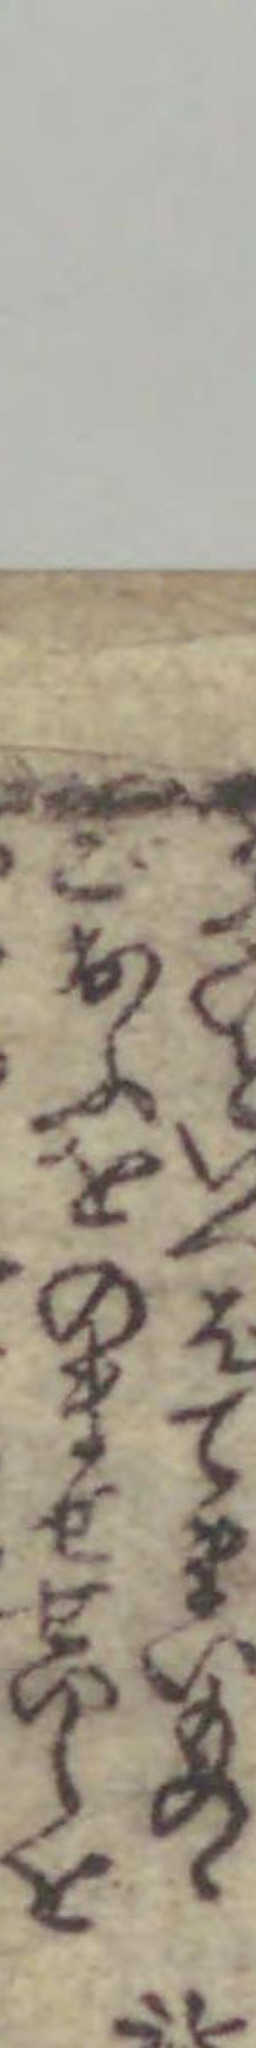ごおふをのませせいしを
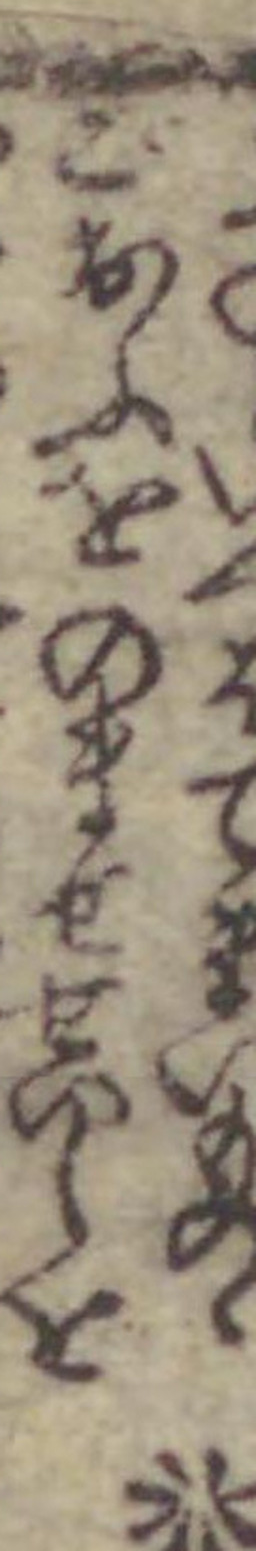ごおふをのませせいしを
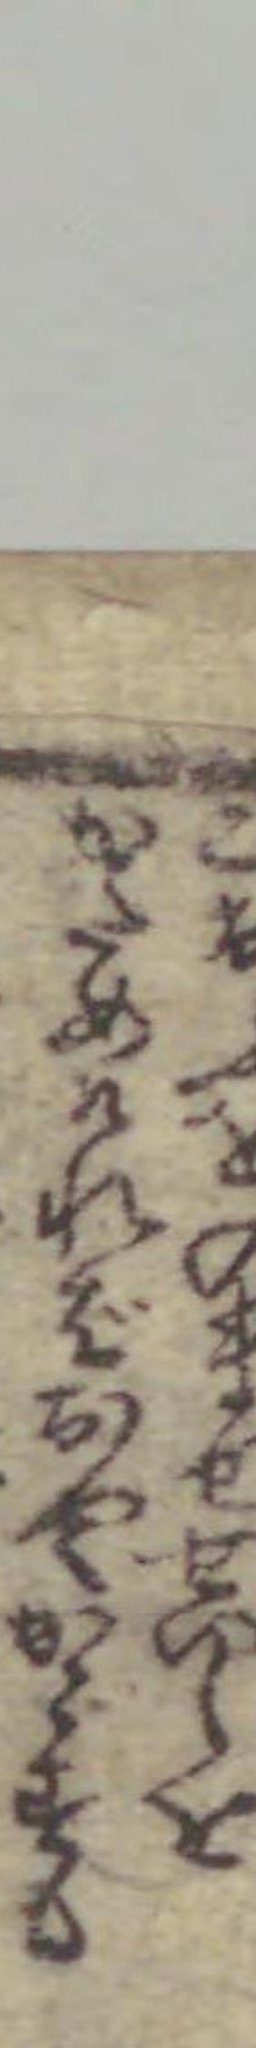かためければおやからする
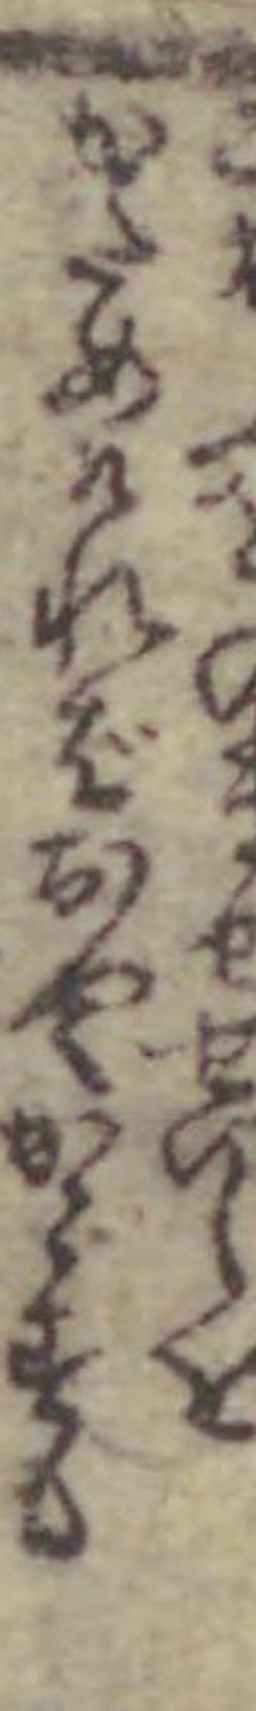かためければおやからする
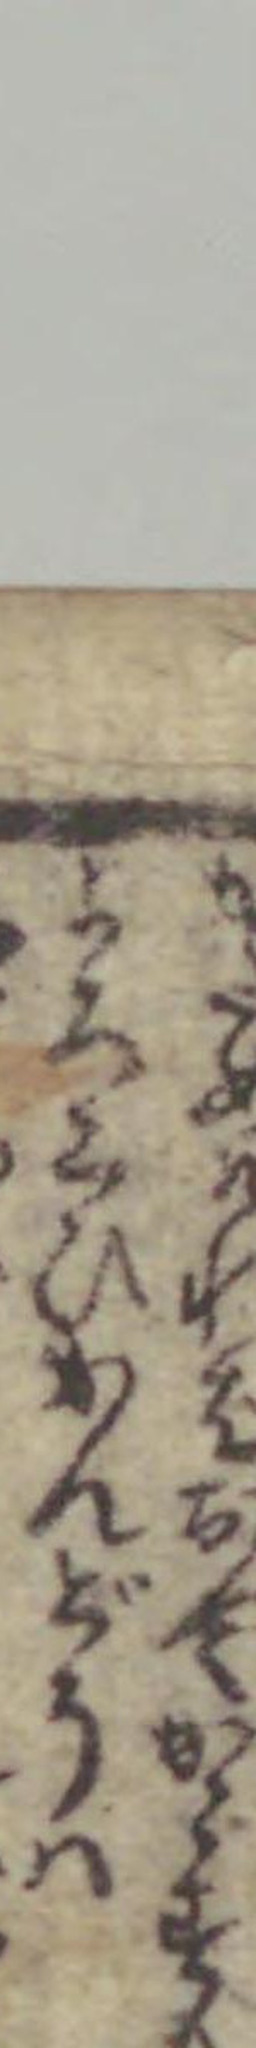よりこひかんどうハ
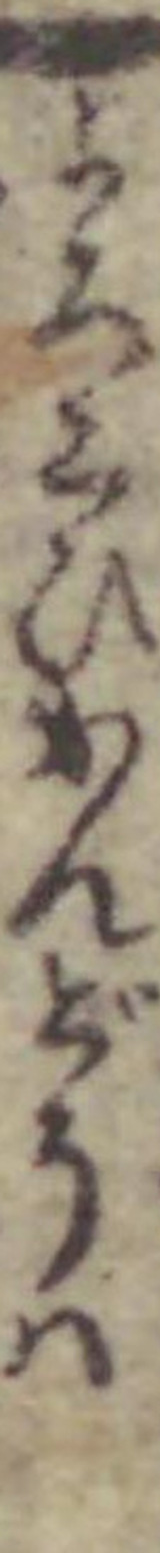よりこひかんどうハ
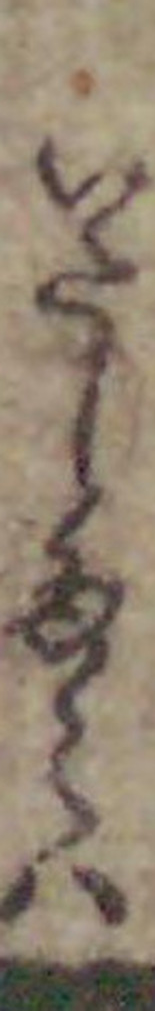いたしたらハ
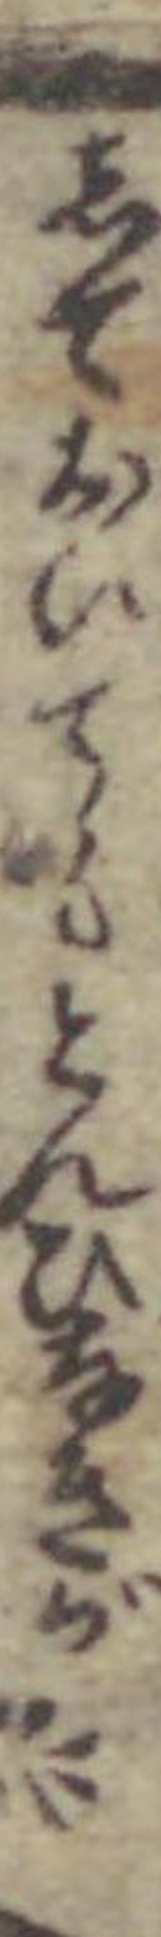しておいてもとんひなきが
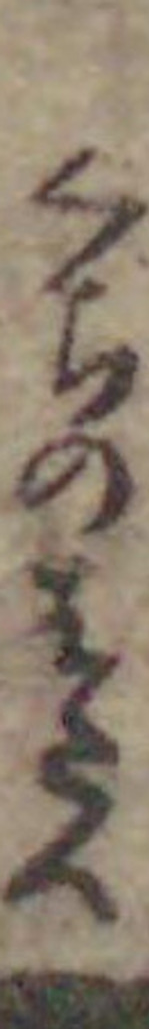くちのはたへ
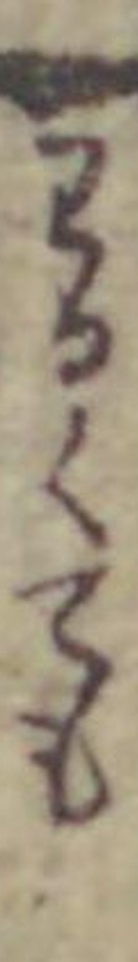わるくても
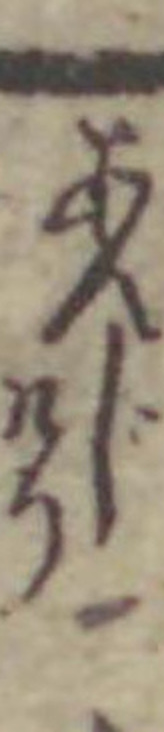あんじけり
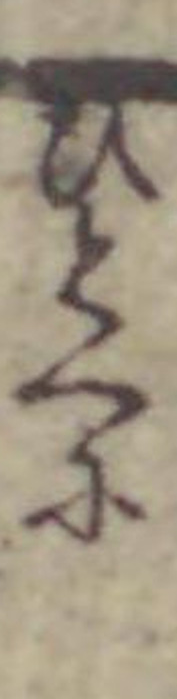ひとへに
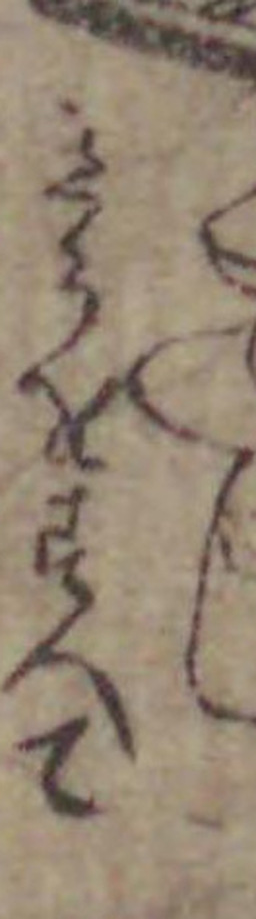きうをすへて
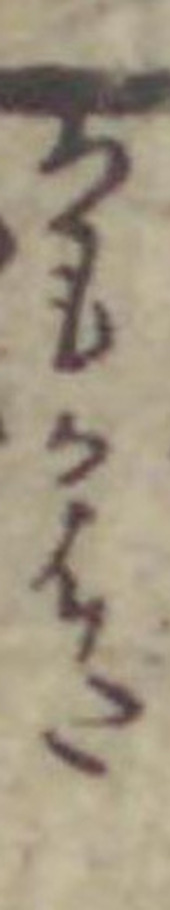かもかはた
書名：烏行水諺草 3巻
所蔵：国立国会図書館 National Diet Library, JAPAN
